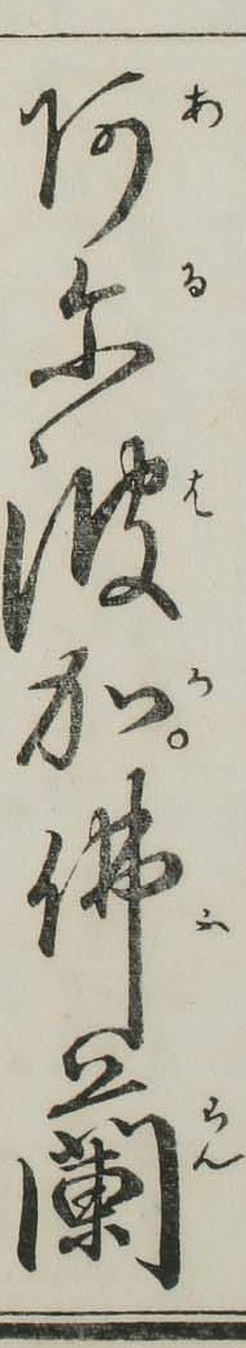阿尓波加。仏蘭
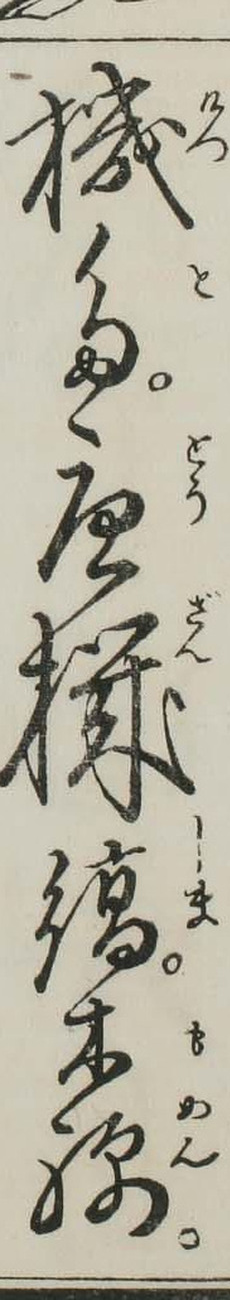機多。唐桟縞。木綿。
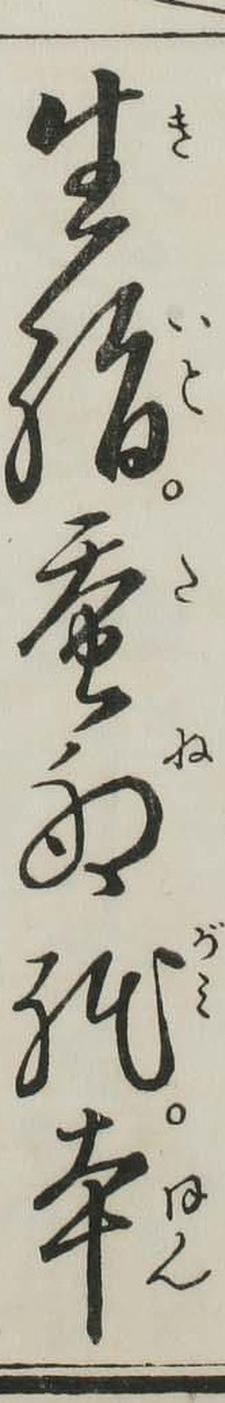生絹。蚕卵紙。本
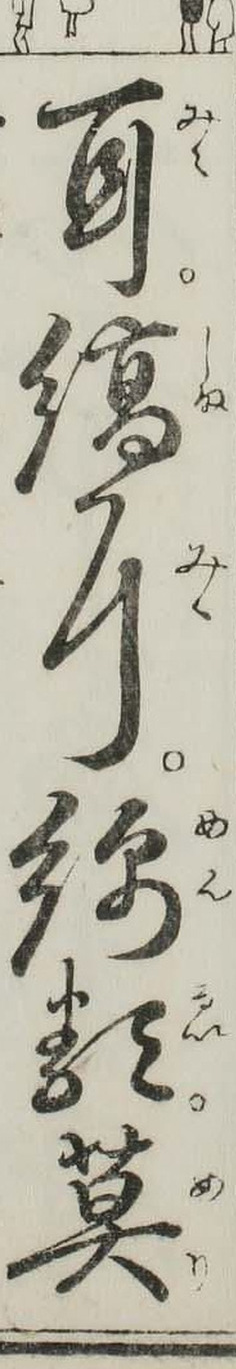耳。縞耳。綿類。莫
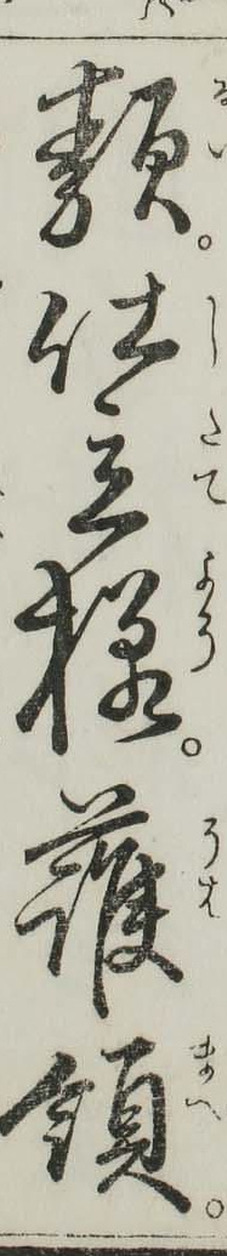類。仕立様。護領。

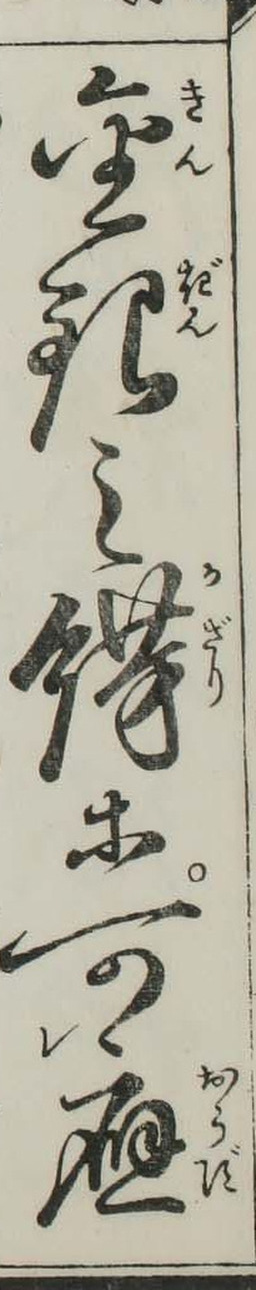金銀之錺等。可応
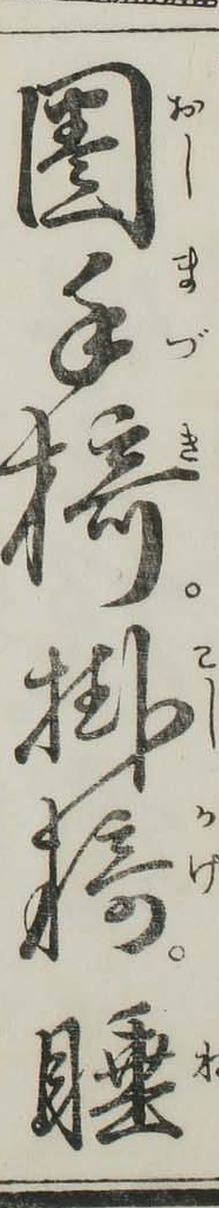圏手椅。掛椅。睡
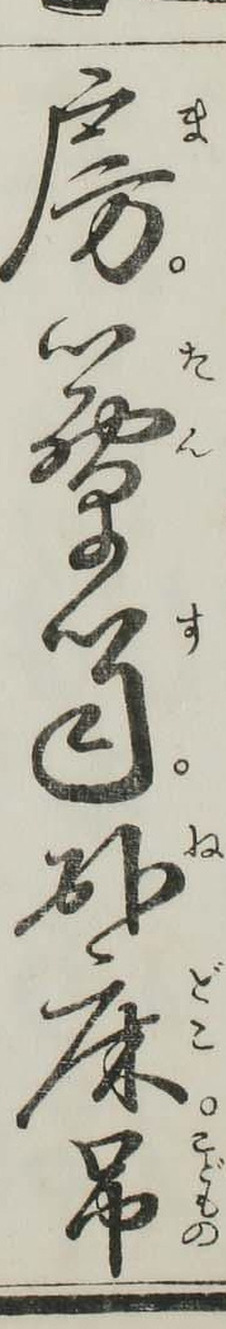房。箪笥。臥床。吊
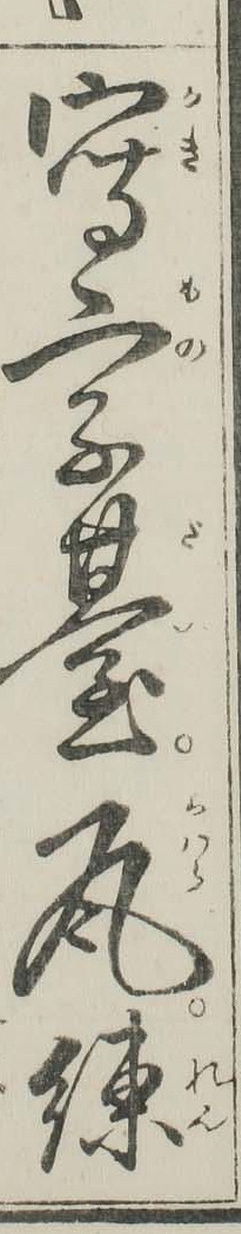写字台。瓦。練
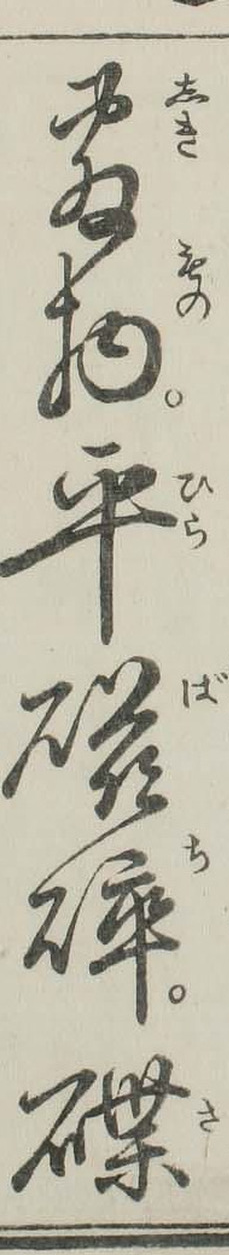敷物。平磁碎。碟

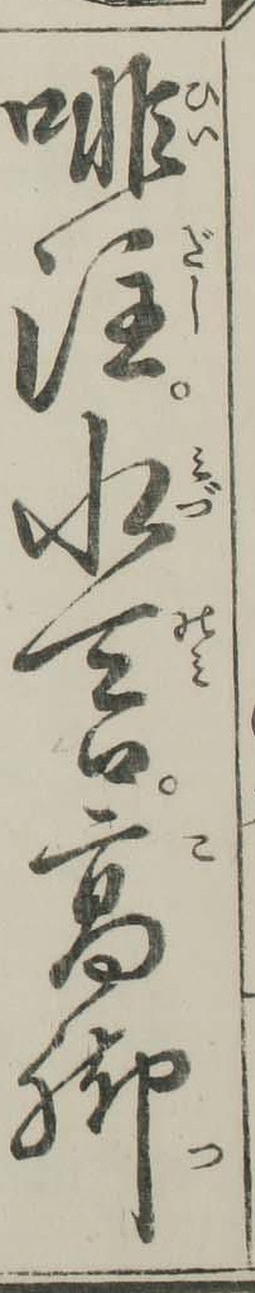琲注。水呑。高脚
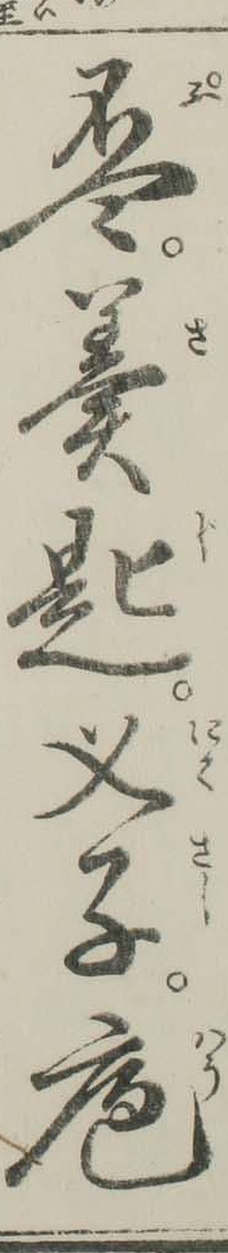盃。羹匙。叉子。包
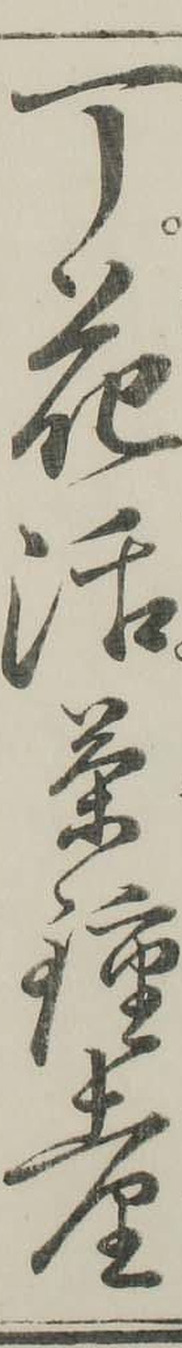丁。花活。茶鍾台。
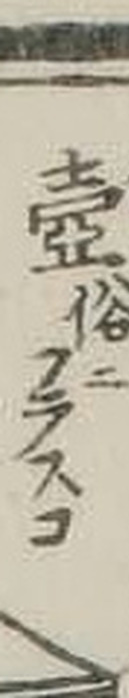酒壺俗ニフラスコ
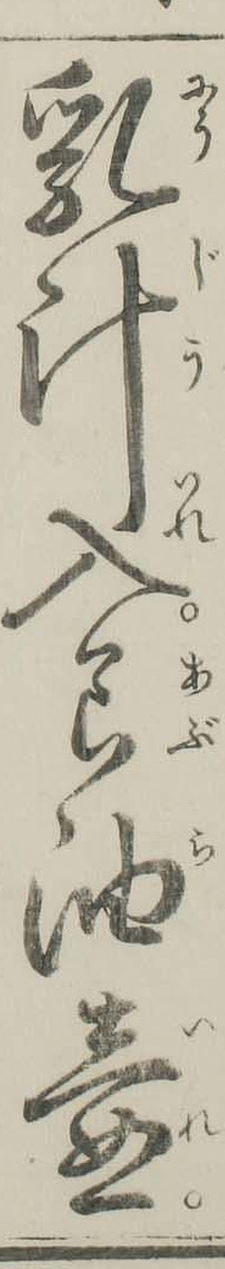乳汁入。食油壺。
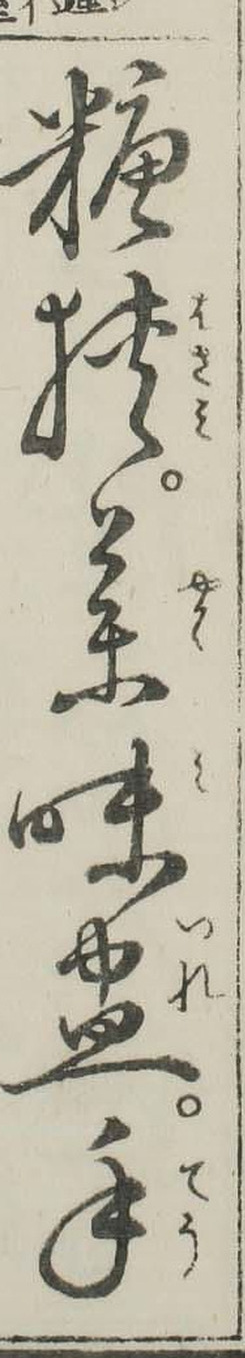糖挟。薬味盅。手
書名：開化往来
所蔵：東京学芸大学教育コンテンツアーカイブ
